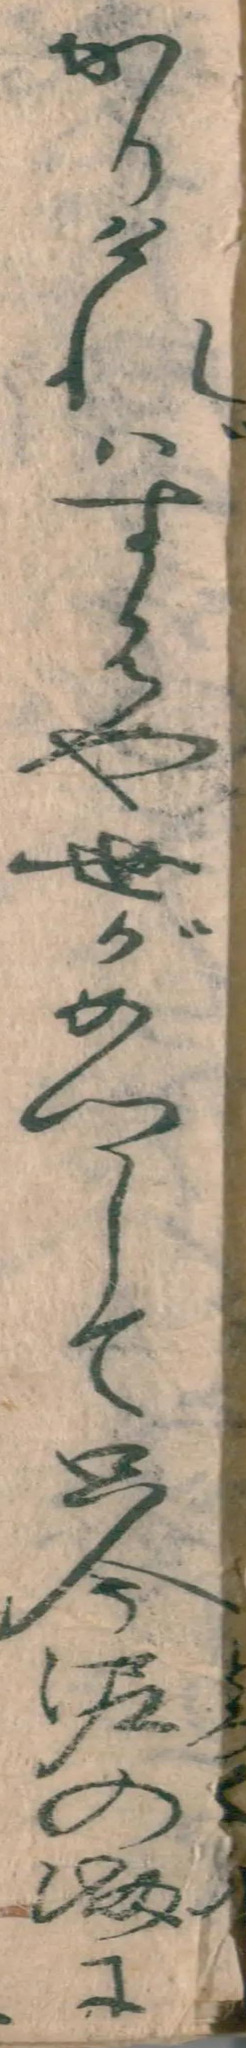かりければすはや世がめつして只今沼の海に
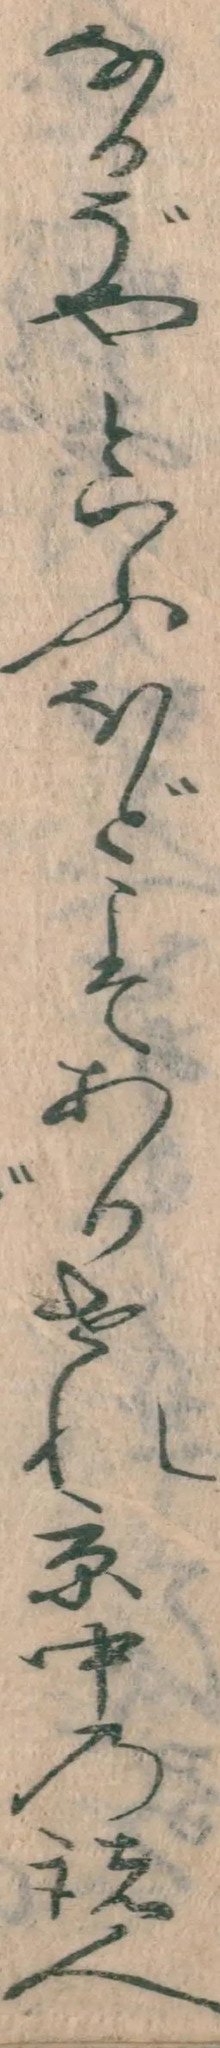なるぞやといふほどこそありけれ京中の諸人
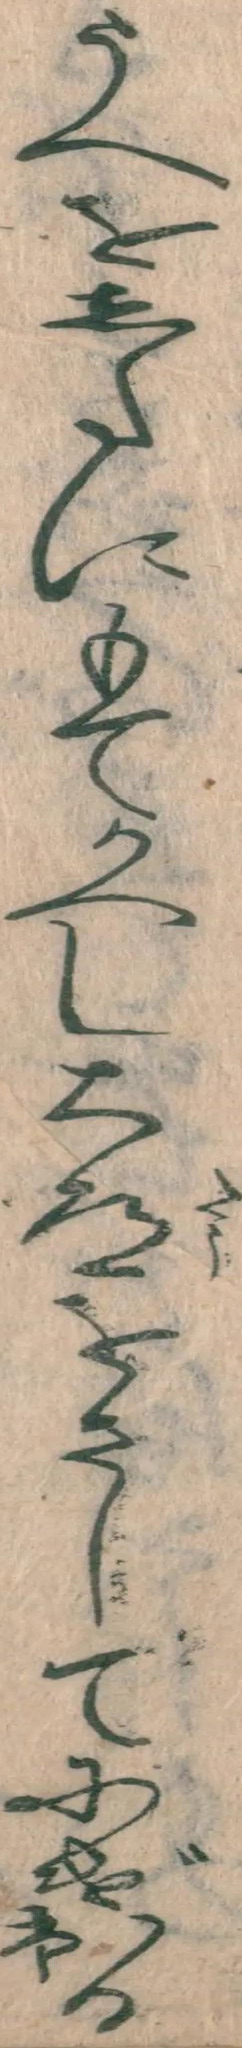うへをしたにもてかへし大道をさしてにげ出る
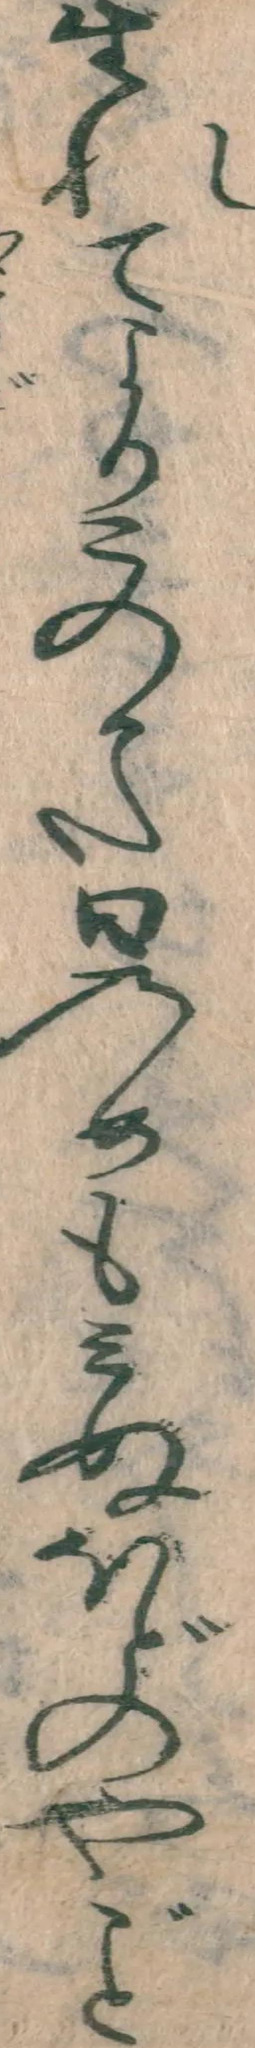生れてよりこのかた日のめもみぬほどのやごと
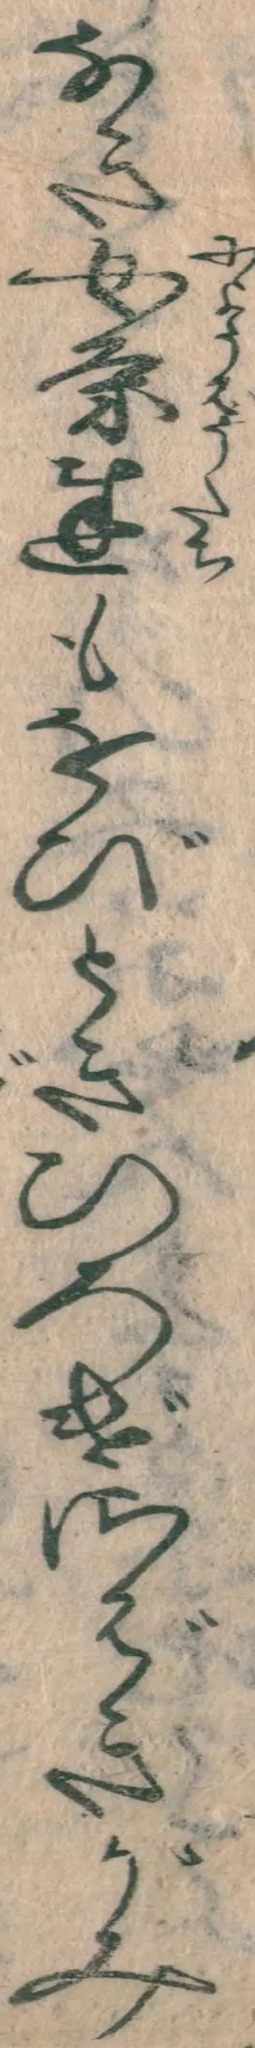なき女房達もをびときひろげさばきがみ
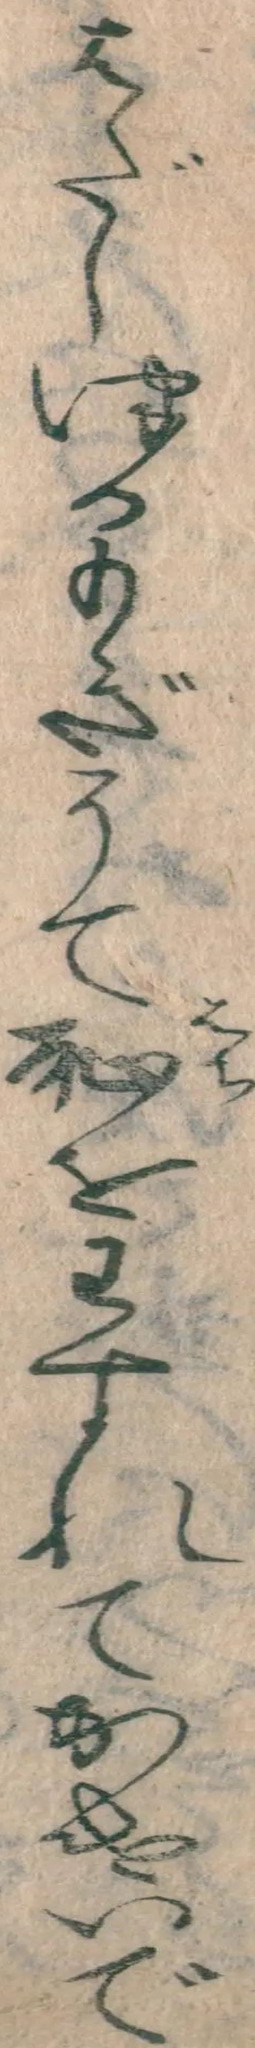はだしつかもぎそて恥をわすれてかけいで
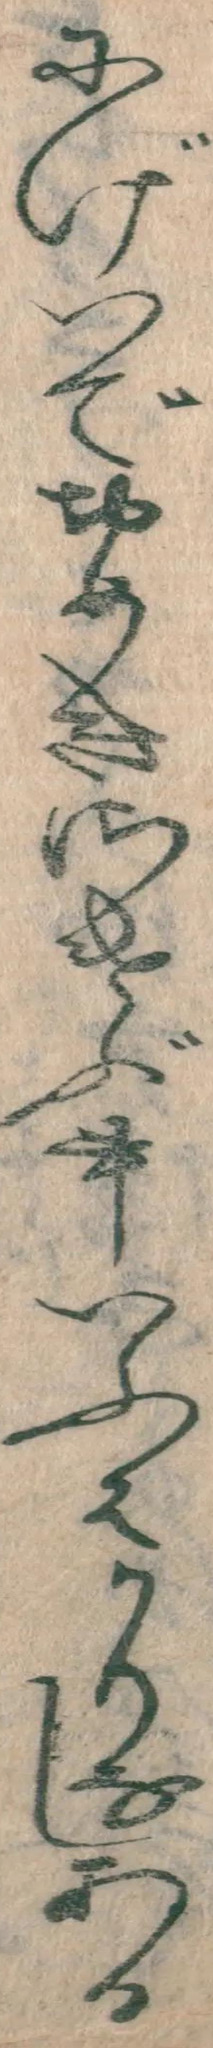にげいでおめきさけぶ事いふはかりなしある
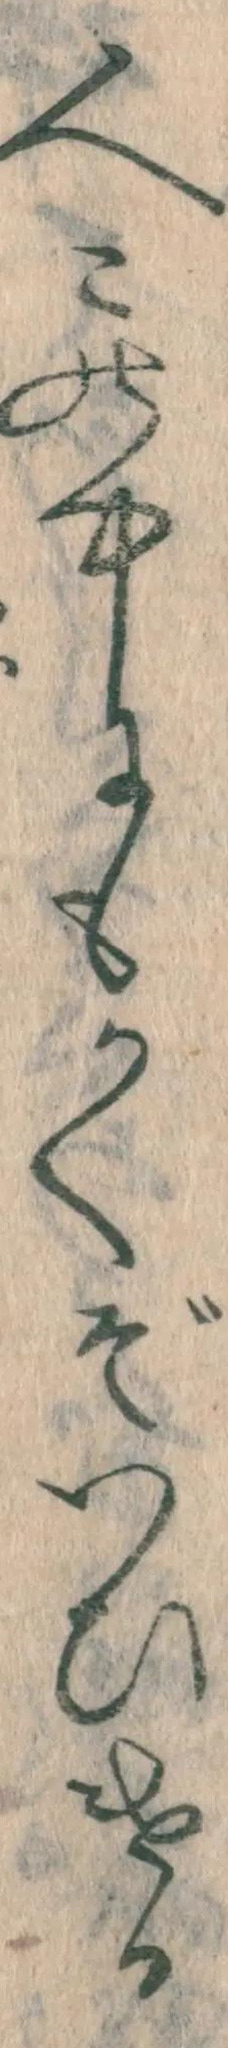人この中にもかくぞいひける
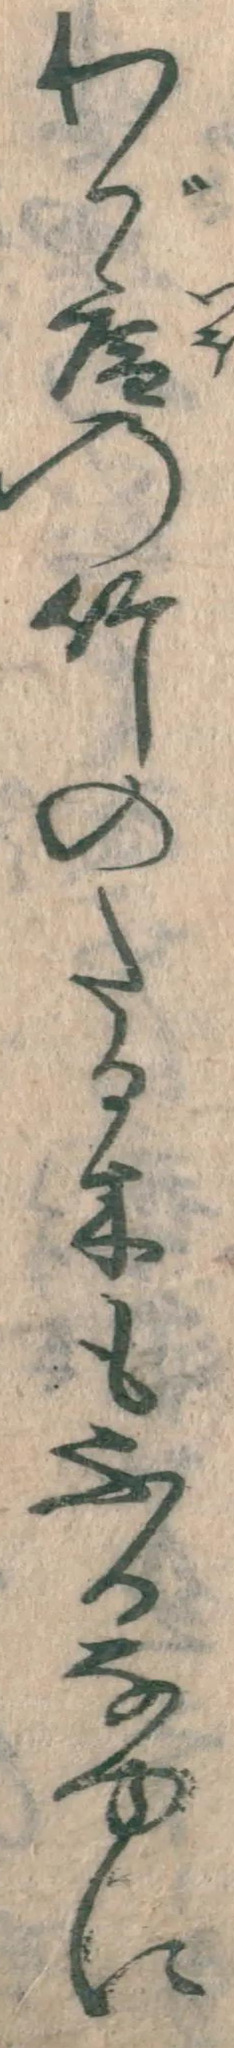わが廬の竹のたる木もふるなやに
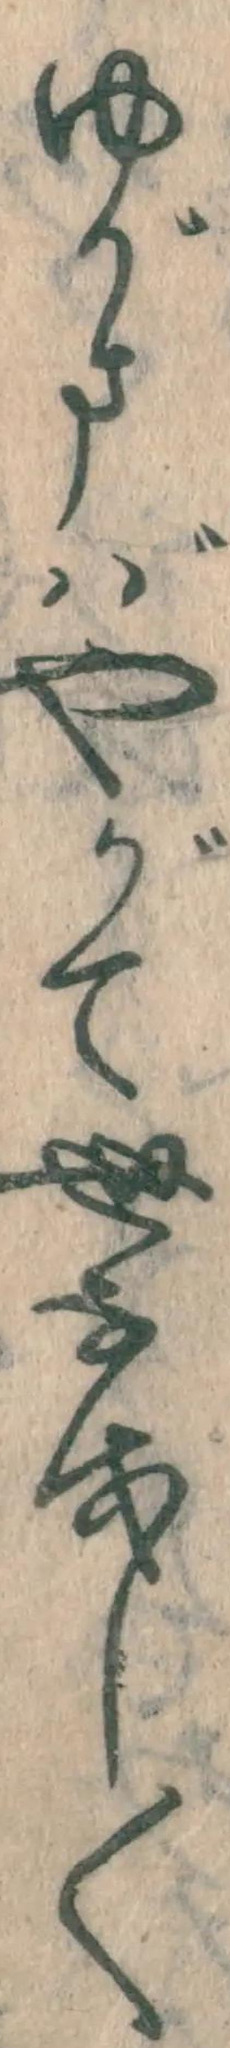ゆがまばやがて世なをし〳〵
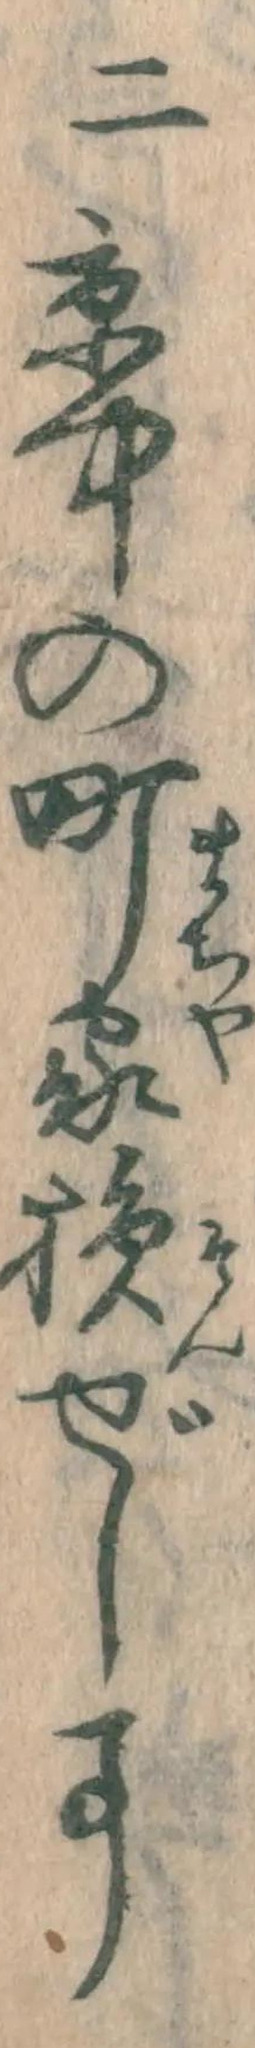二京中の町家損ぜし事

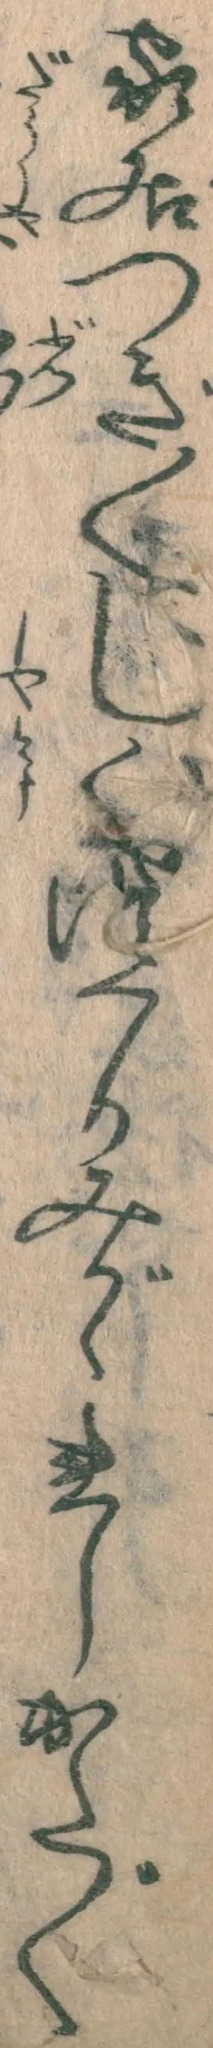家居つき〴〵しくつくりみがゝれしかた〴〵
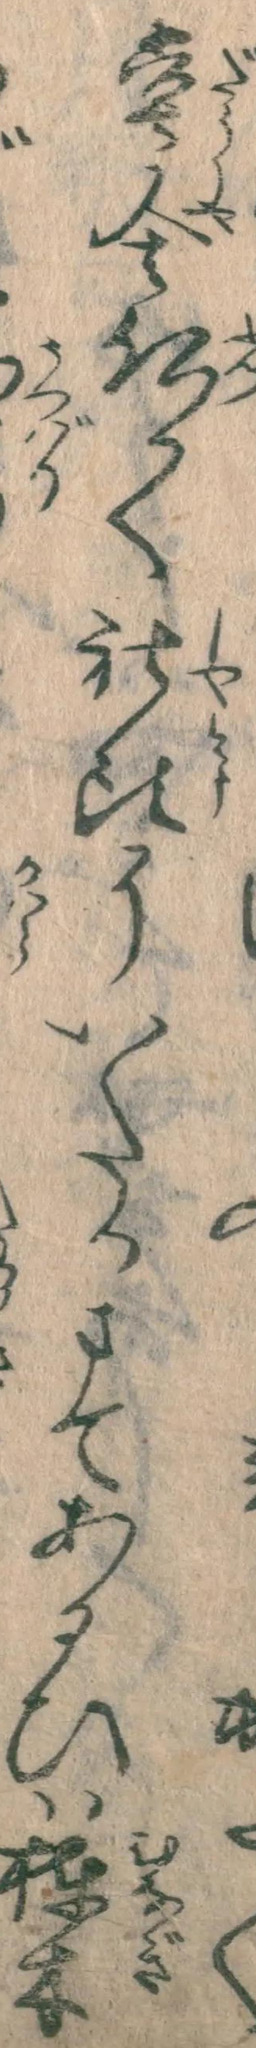堂舎仏かく社頭にいたるまてあるひは棟木
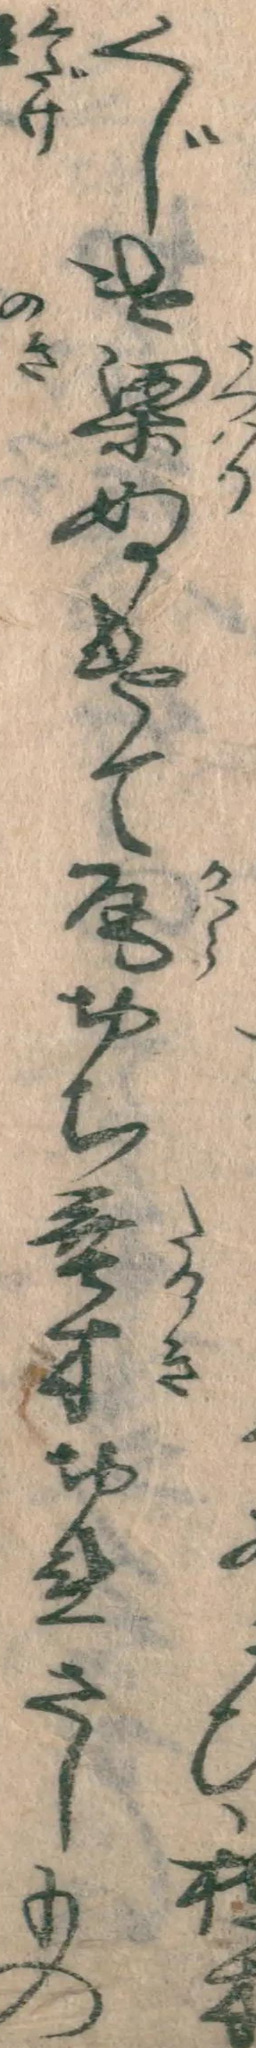くじけ梁ぬけて瓦おち垂木おれさしもの
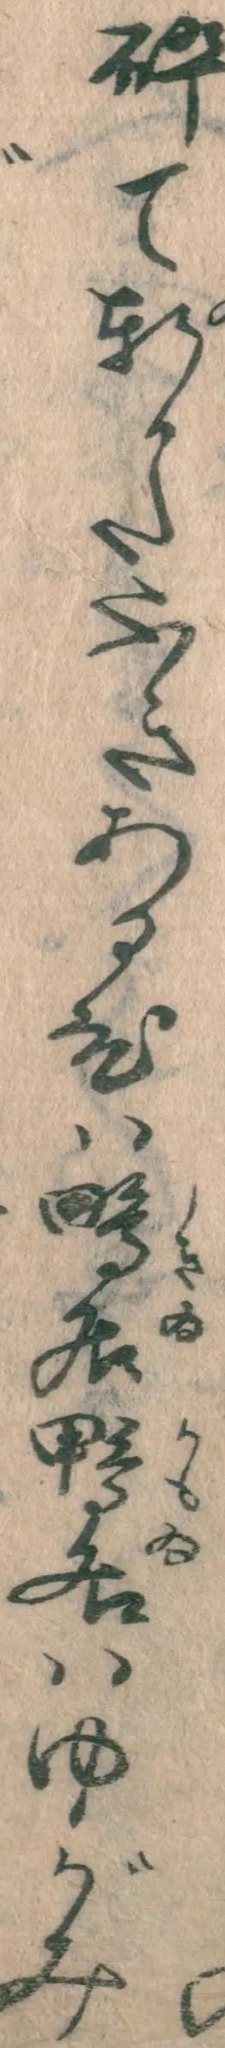砕て軒かたふきあるひは鴫居鴨居はゆがみ
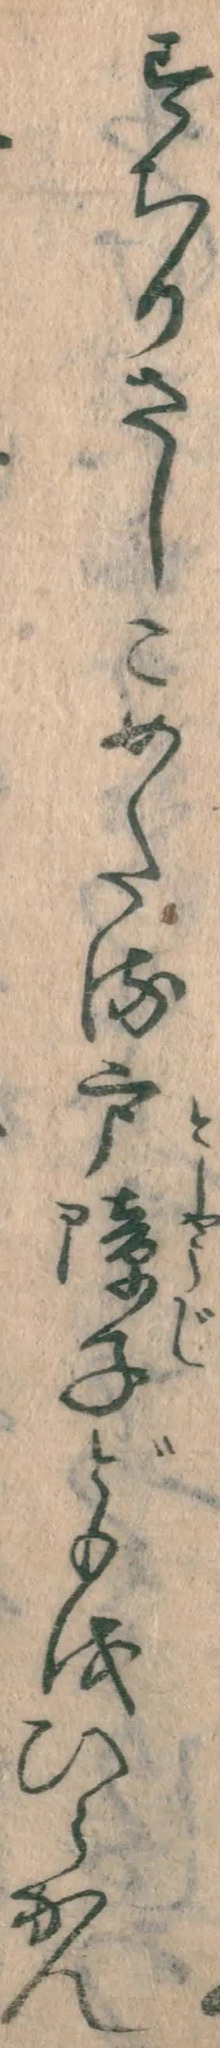すじりさしこめたる戸障子どもをひらかん
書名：艱難目異志. 上,下
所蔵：国立国会図書館 National Diet Library, JAPAN
